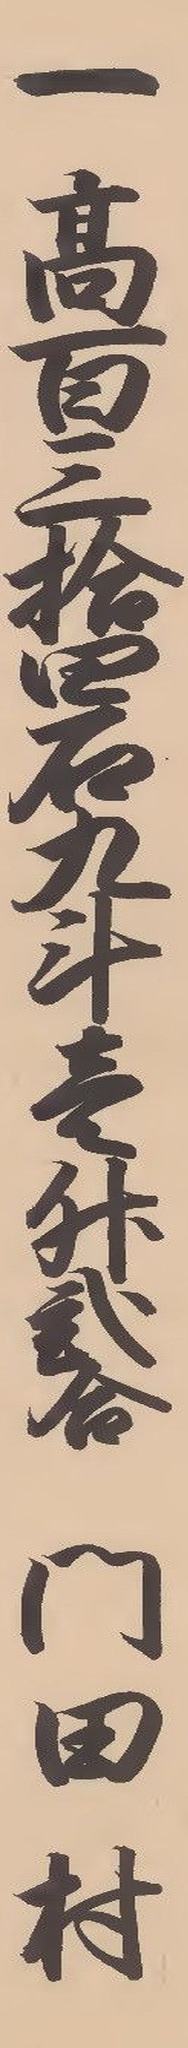一髙百三拾四石九斗壱升弐合門田村
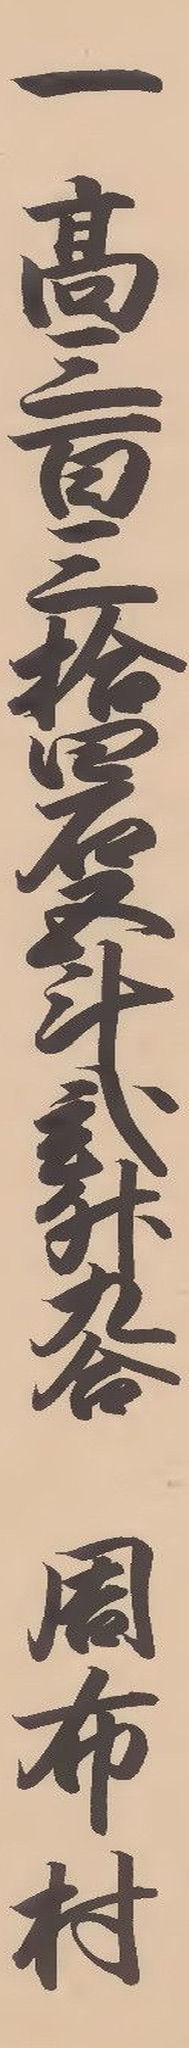一髙三百三拾四石五斗弐升九合周布村
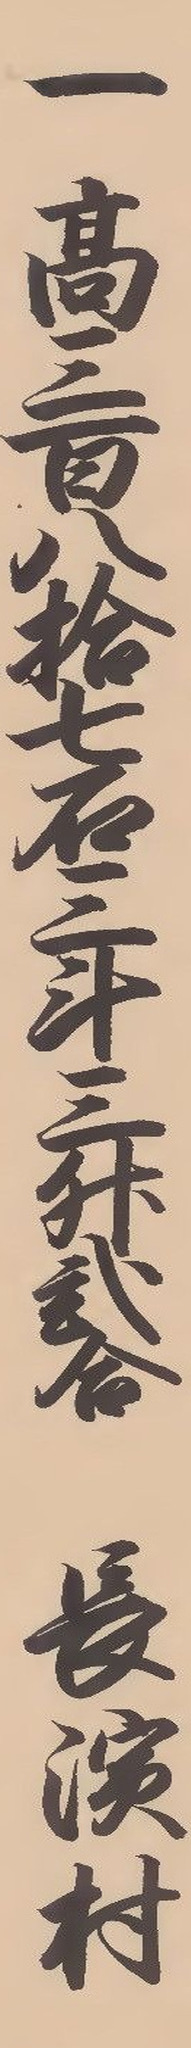一髙三百八拾七石三斗三升弐合長濱村
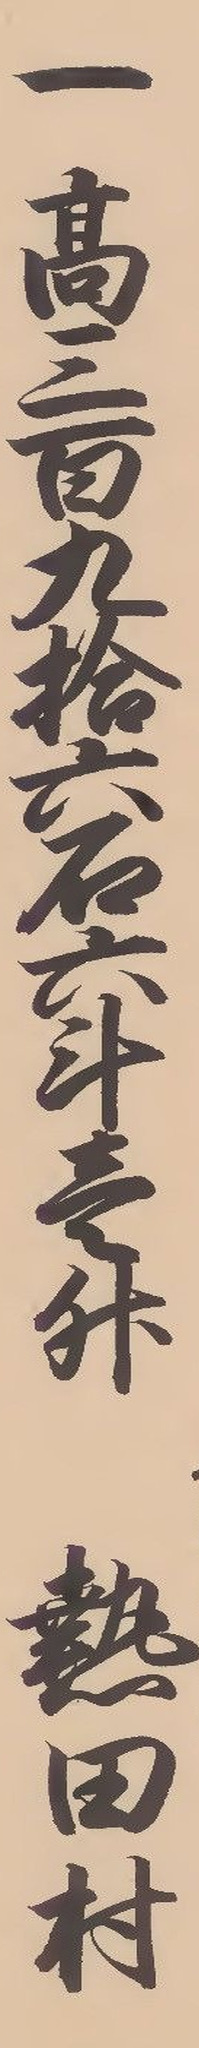一髙三百九拾六石六斗壱升熱田村

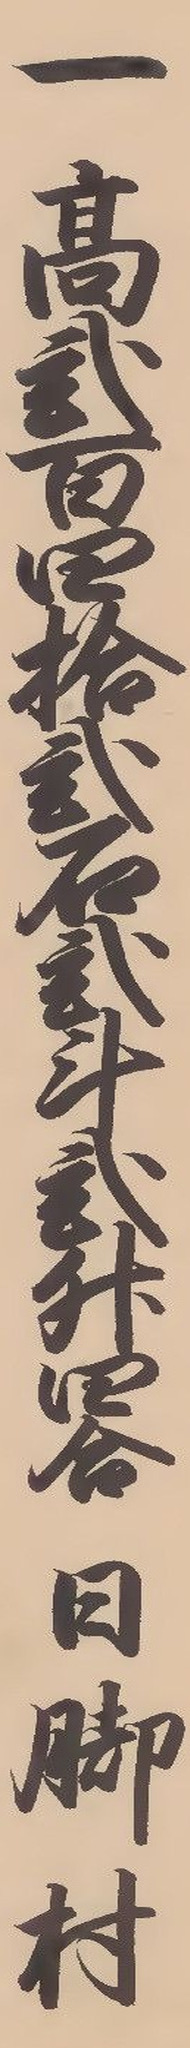一髙弐百四拾弐石弐斗弐升四合日脚村
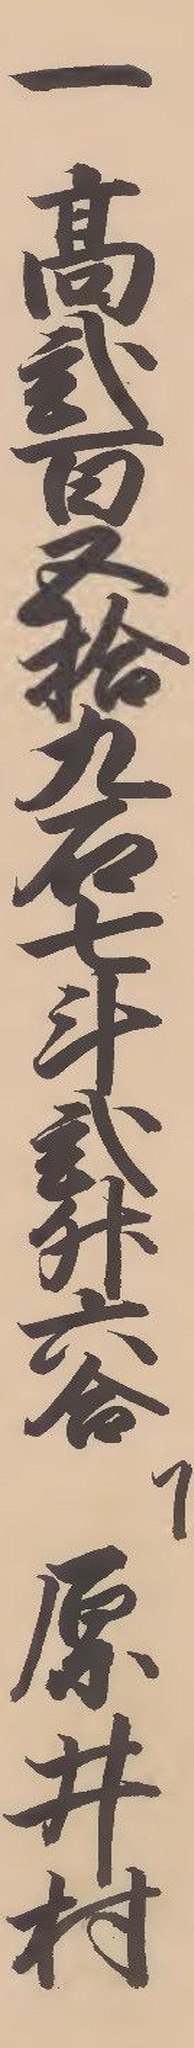一髙弐百五拾九石七斗弐升六合原井村
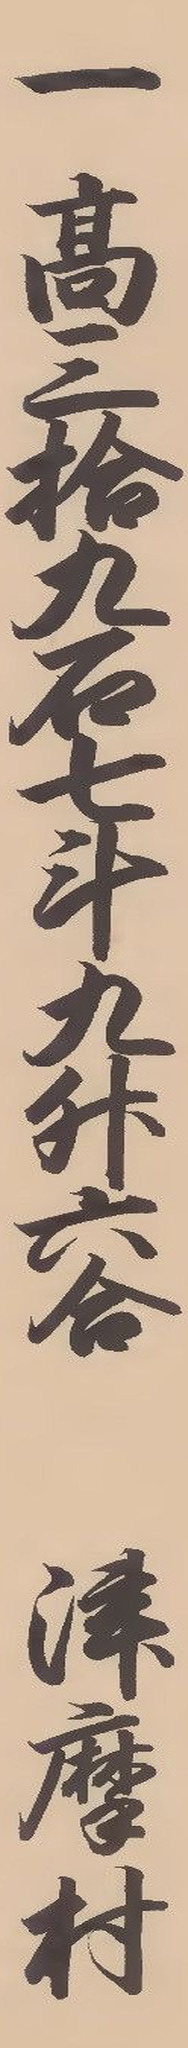一髙三拾九石七斗九升六合津摩村
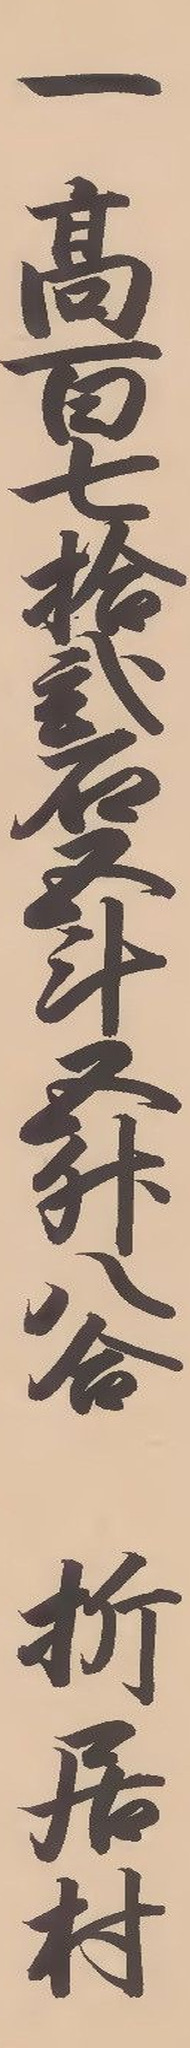一髙百七拾弐石五斗五升八合折居村
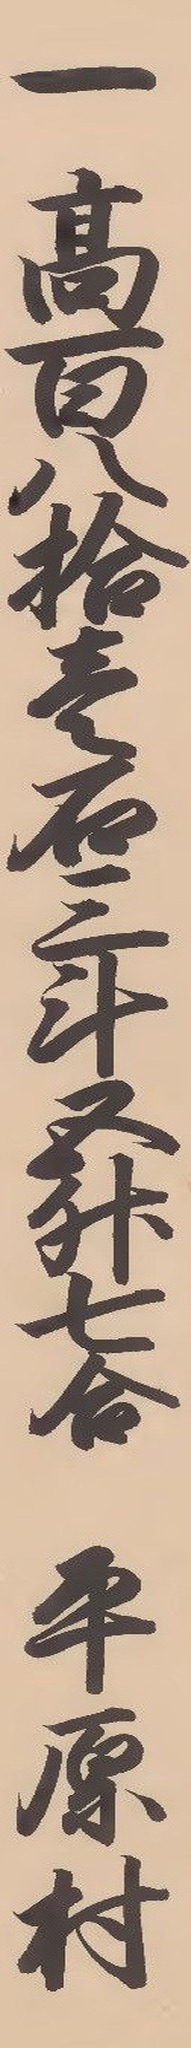一髙百八拾壱石三斗五升七合平原村
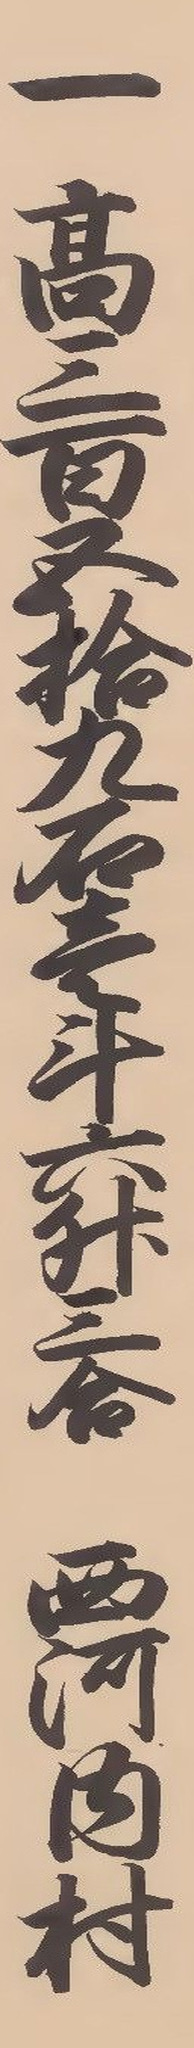一髙三百五拾九石壱斗六升三合西河内村
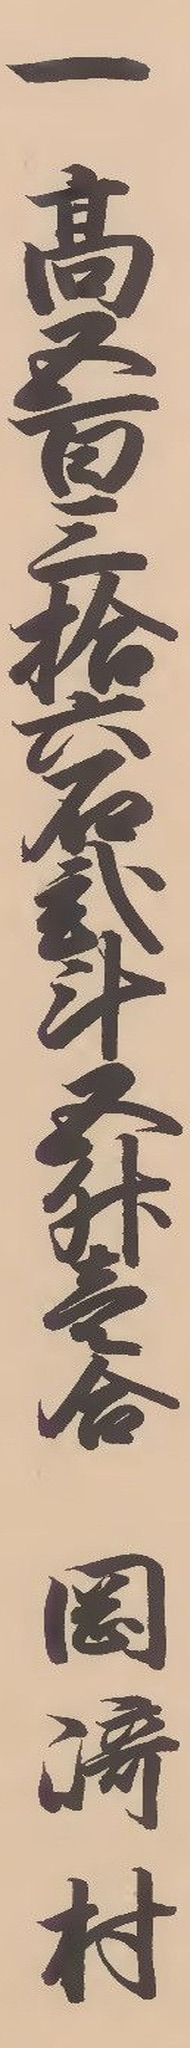一髙五百三拾六石弐斗五升壱合岡崎村

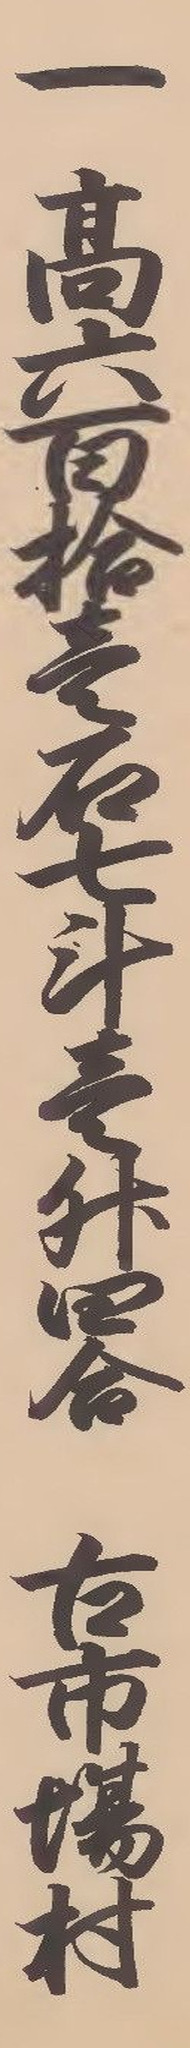一髙六百拾壱石七斗壱升四合古市場村
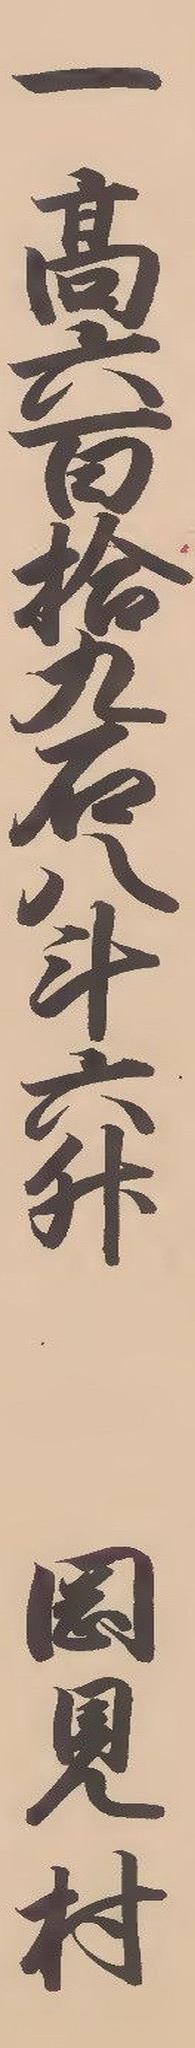一髙六百拾九石八斗六升岡見村
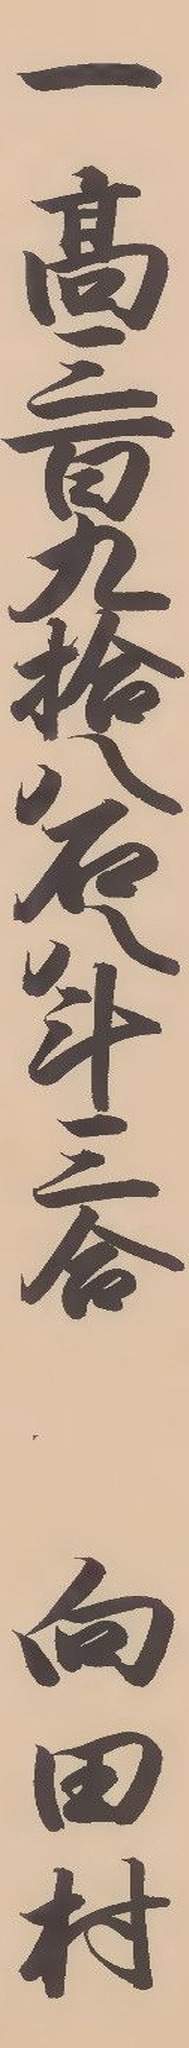一髙三百九拾八石八斗三合向田村
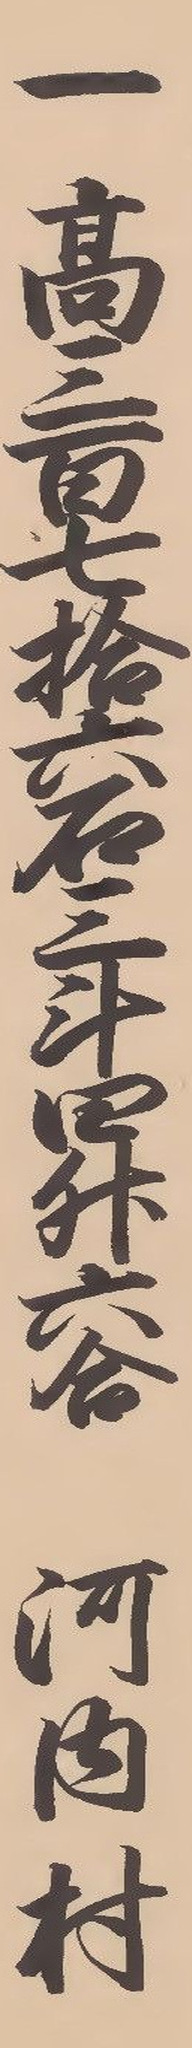一髙三百七拾六石三斗四升六合河内村
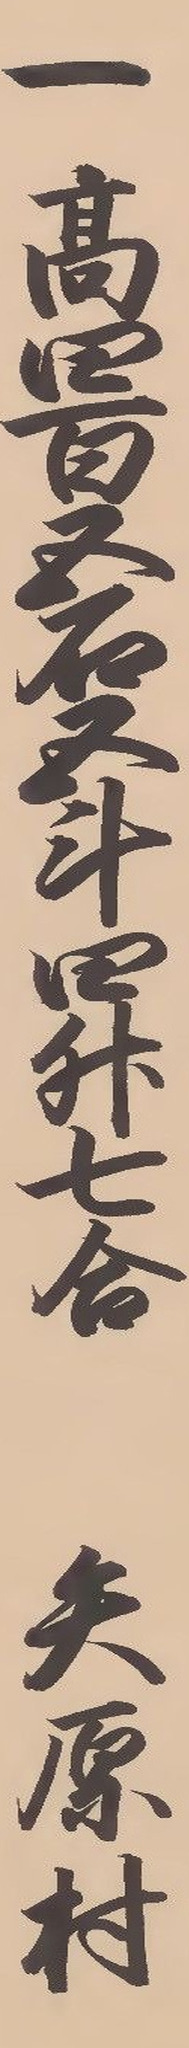一髙四百五石五斗四升七合矢原村
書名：石見国郷帳
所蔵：国立公文書館 National Archives of Japan
